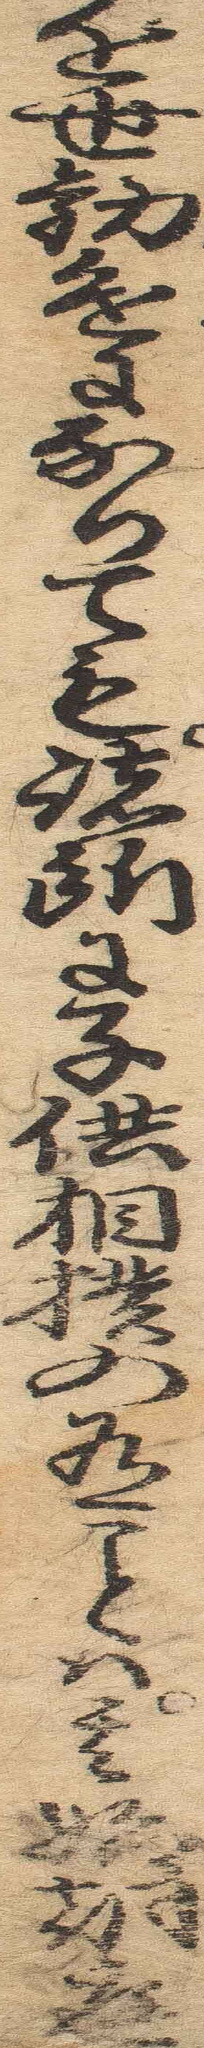近世勧進になりても。諸所に子供相撲の有ことは。其始朝庭
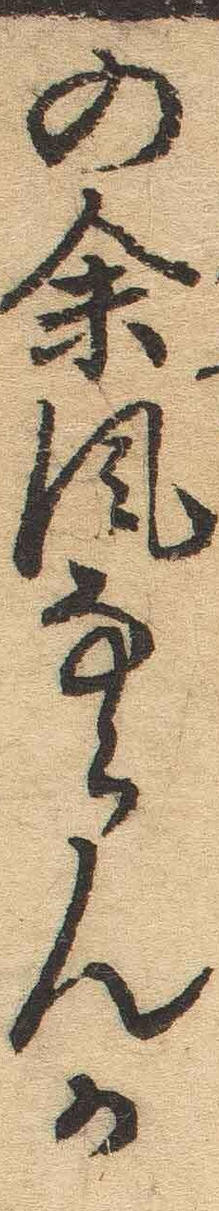の余風ならんか
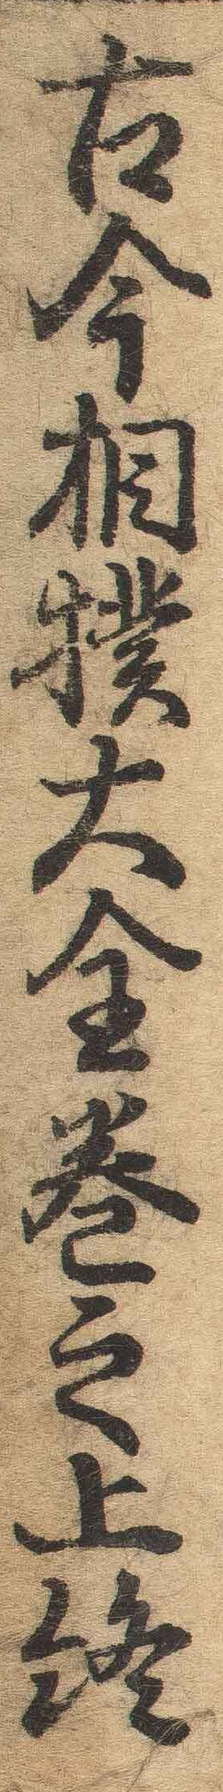古今相撲大全巻之上終

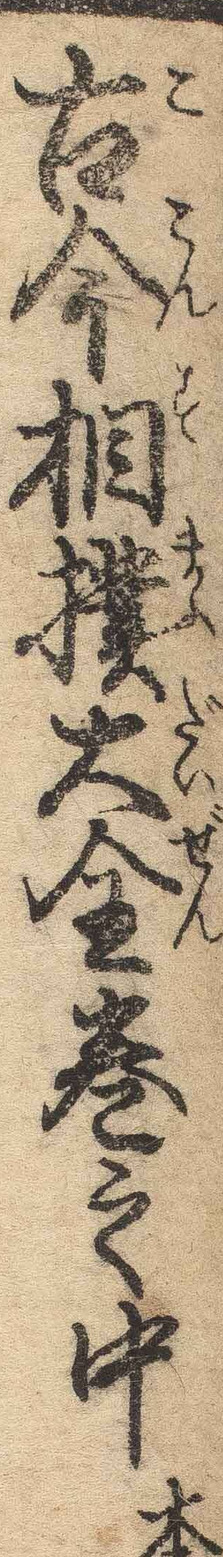古今相撲大全巻の中未
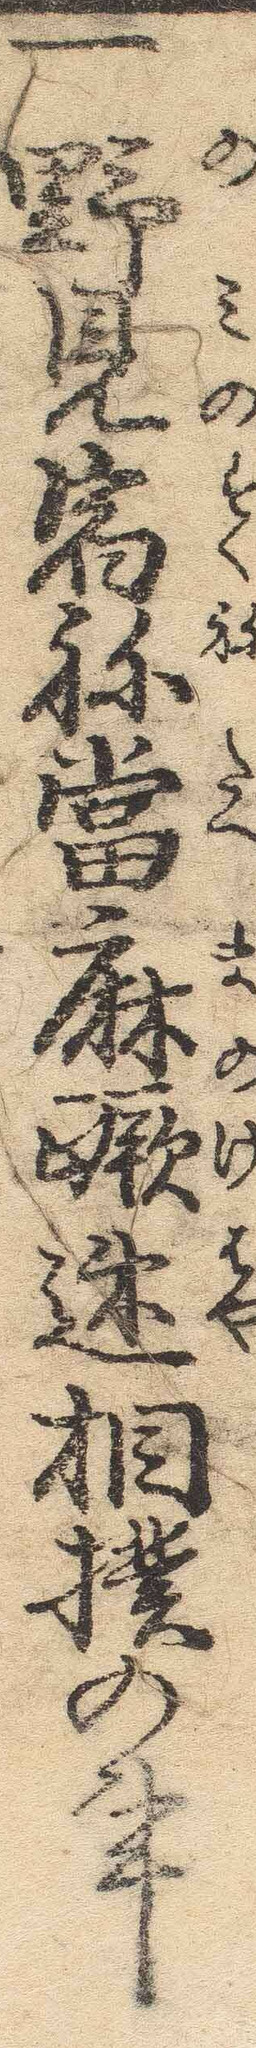一野見宿祢当麻蹶速相撲の事
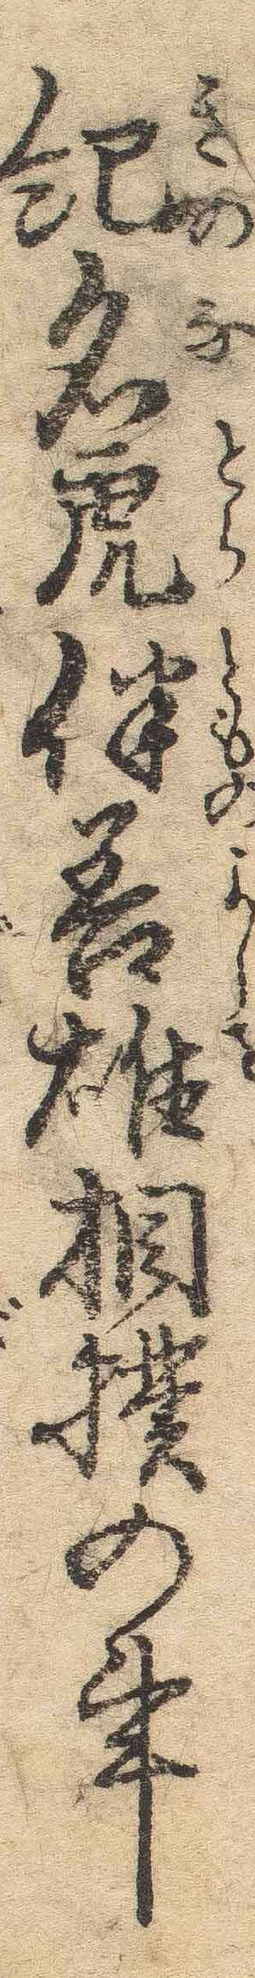一紀名虎伴善雄相撲の事
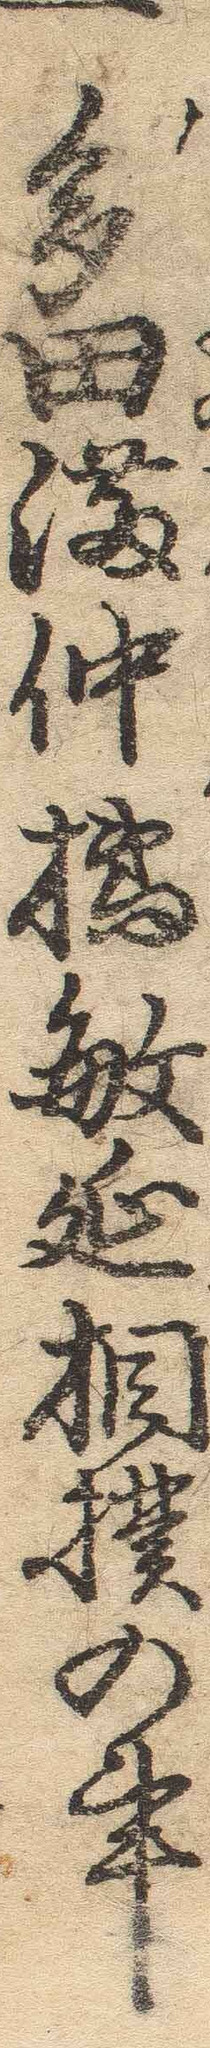一多田満仲橘敏延相撲の事
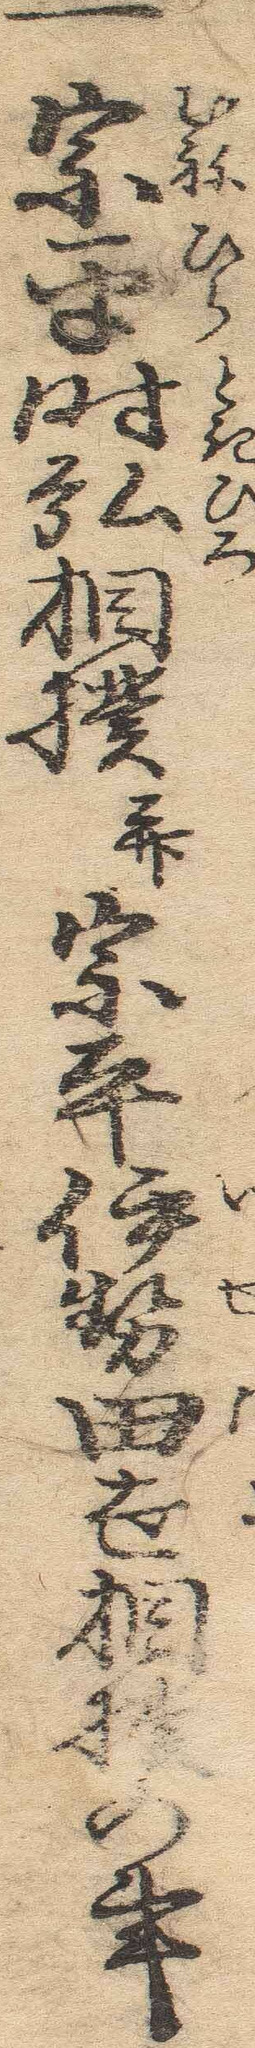一宗平時弘相撲并宗平伊勢田世相撲の事
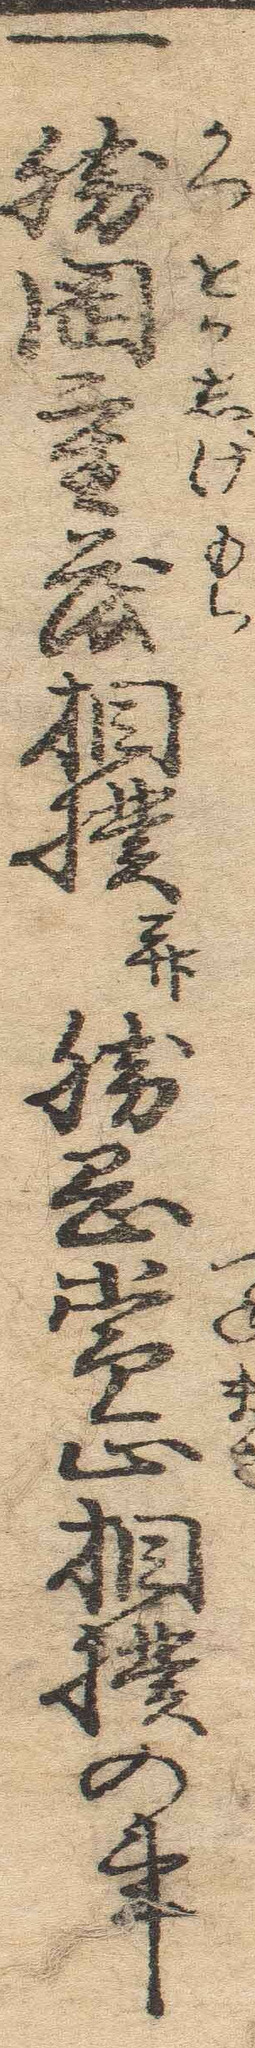一勝岡重茂相撲并勝岡常正相撲の事
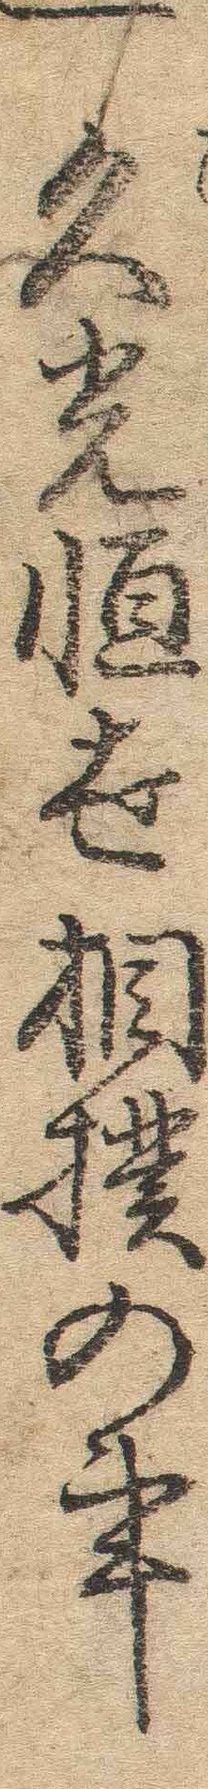一久光恒世相撲の事
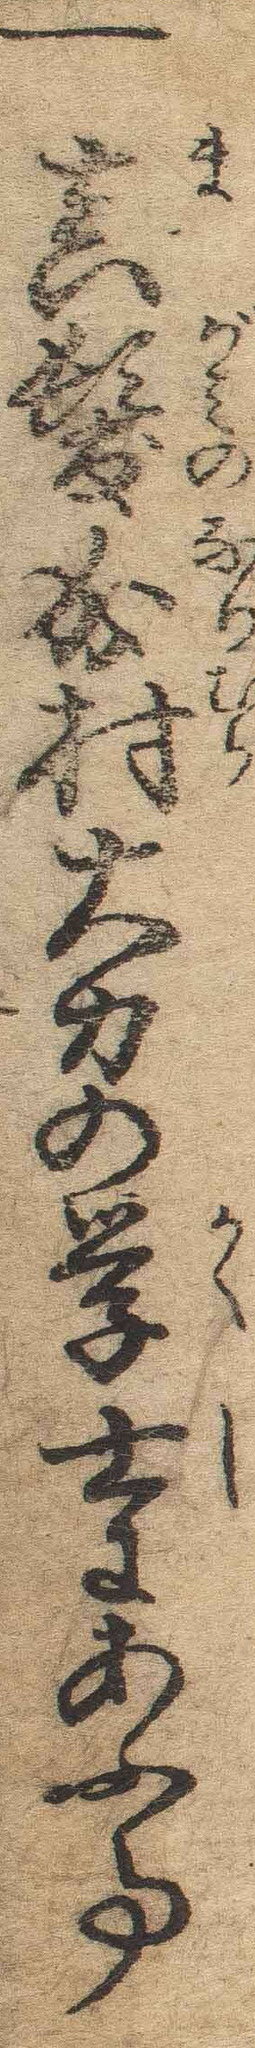一真髪成村大力の学士にあふ事

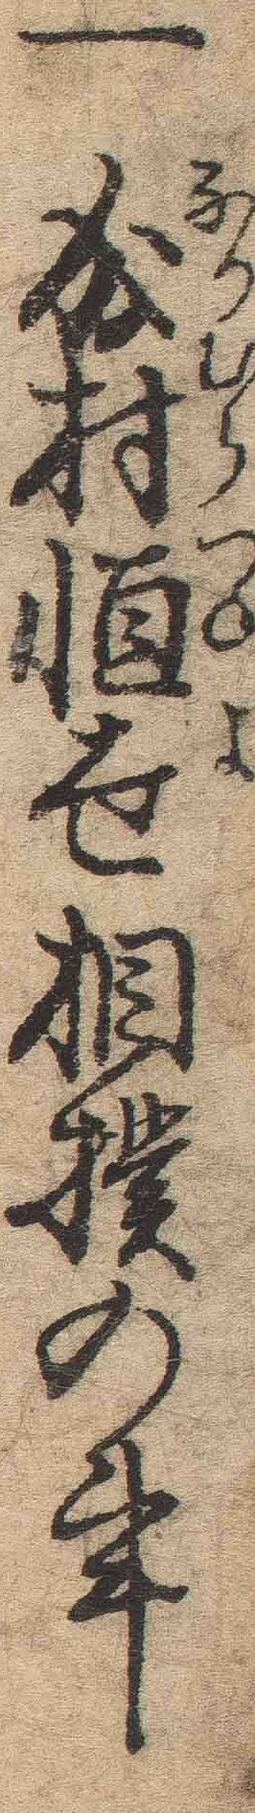「一成村恒世相撲の事
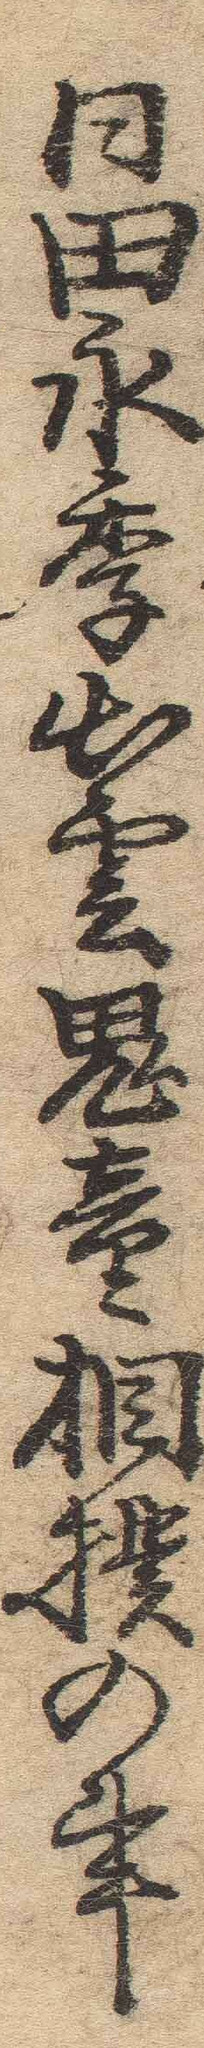一日田永季出雲鬼童相撲の事
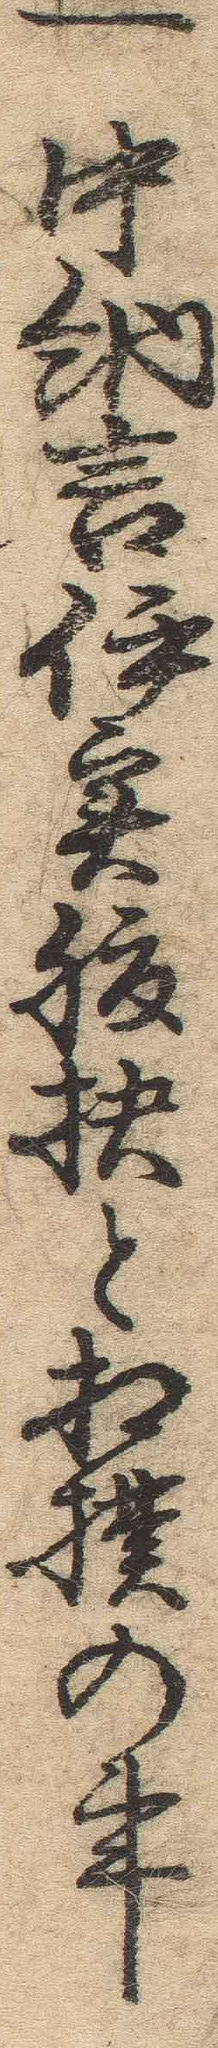一中納言伊実腹抉と相撲の事
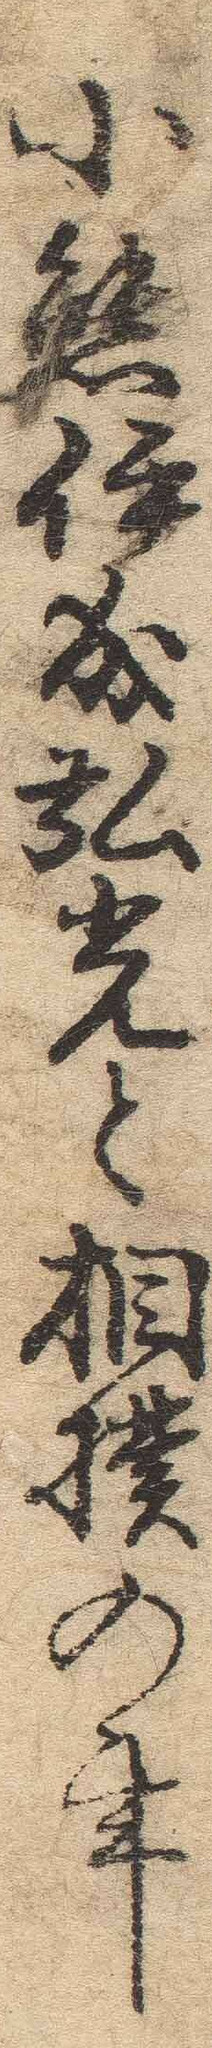一小熊伊成弘光と相撲の事
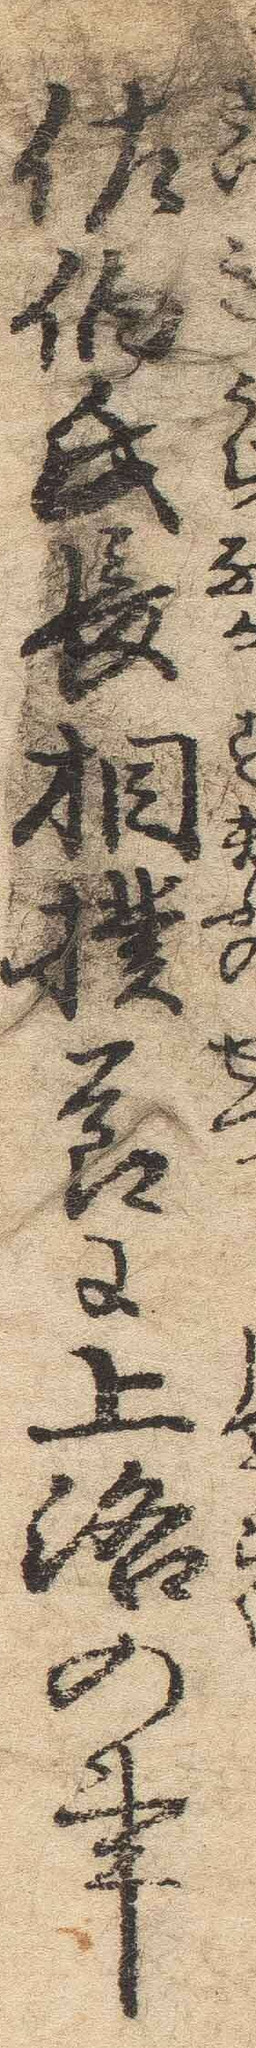一佐伯氏長相撲節に上洛の事
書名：古今相撲大全
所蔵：東京学芸大学附属図書館 国文学研究資料館
